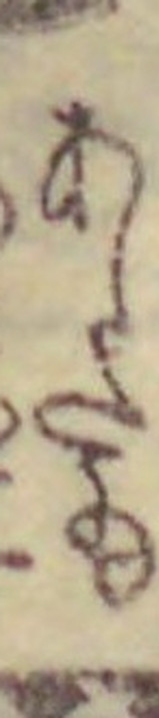あしたも
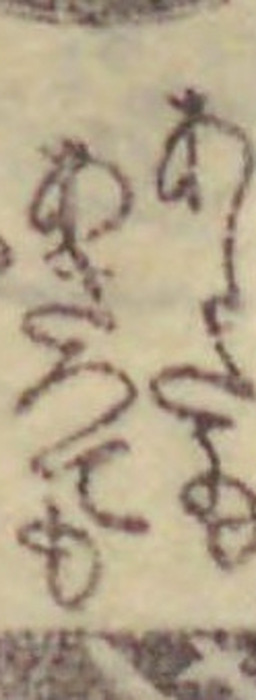あさつても
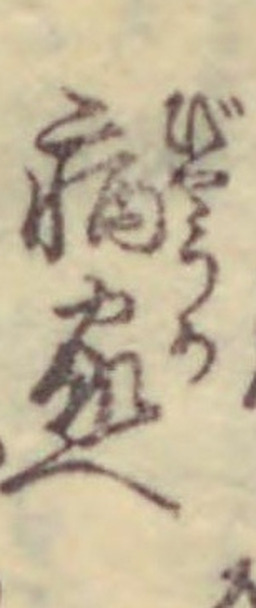病家へ
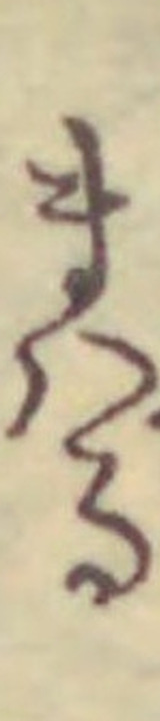まはる
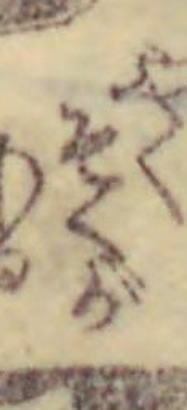そくが
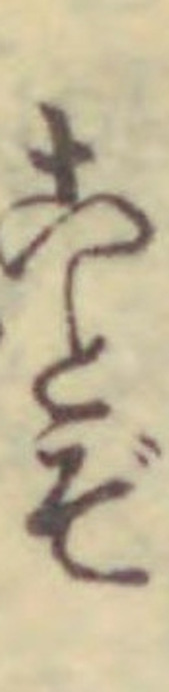ことぞ
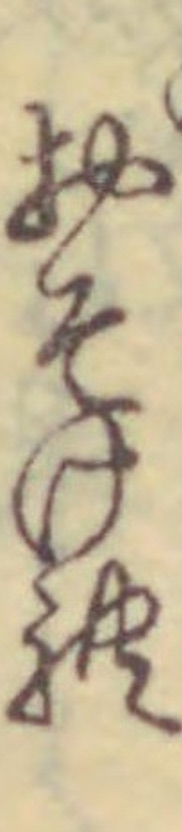おそけれ
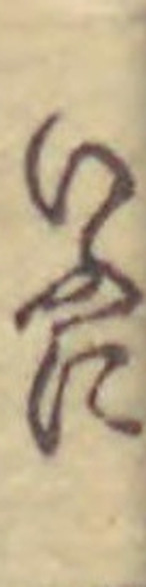いふに
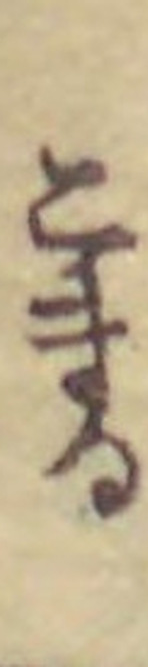こまる
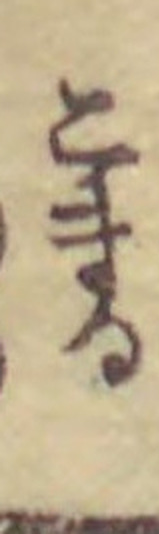こまる
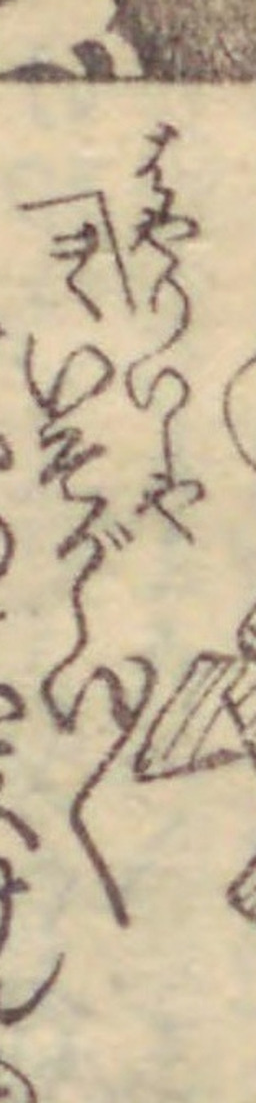〽ヲヽいそがしい〳〵
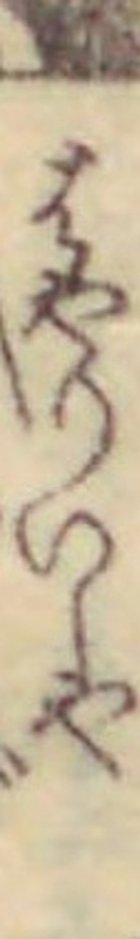はやりいしや
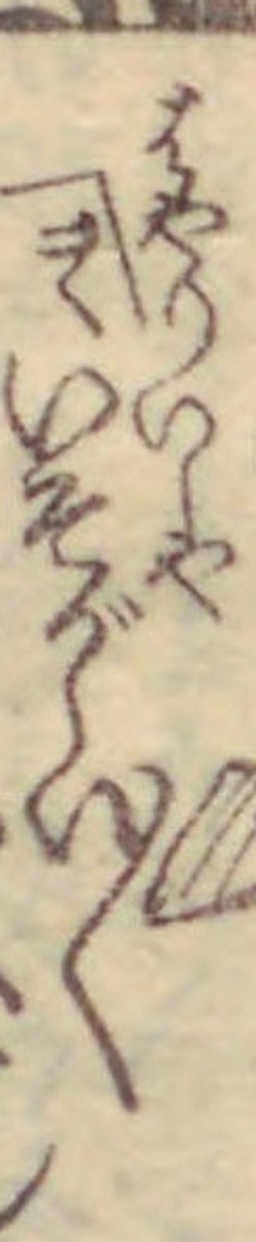〽ヲヽいそがしい〳〵
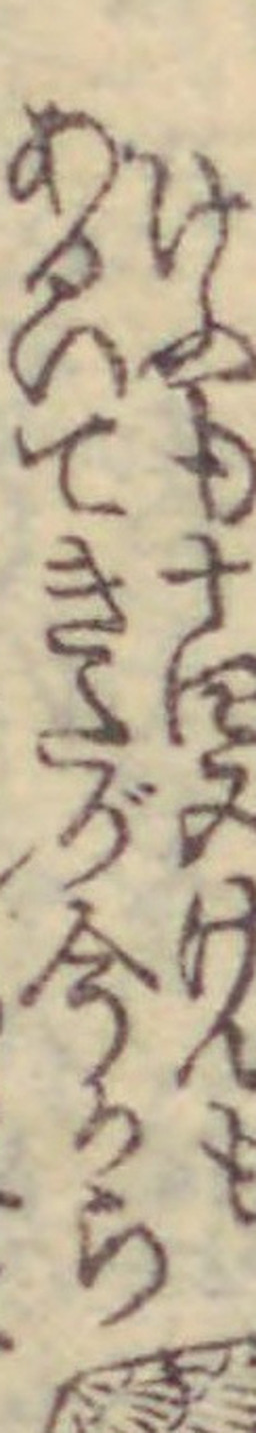あるいてきたが今から
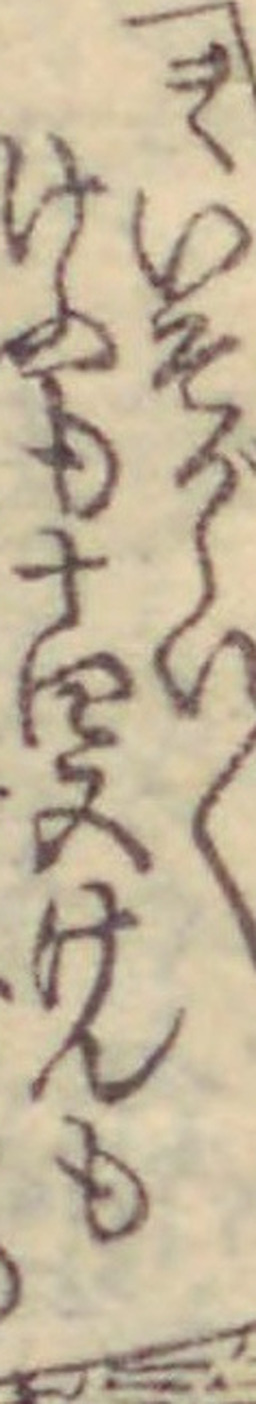けふも十四五けんも
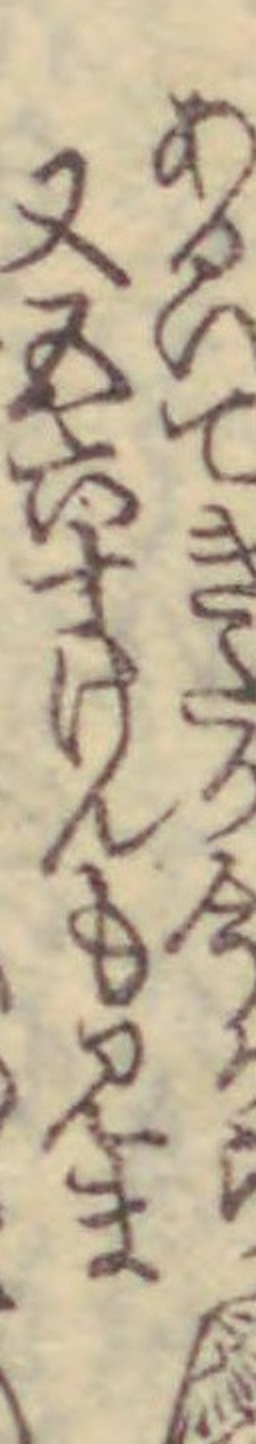又五六十けんも見ま
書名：腹内窺機関 2巻
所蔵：国立国会図書館 National Diet Library, JAPAN
